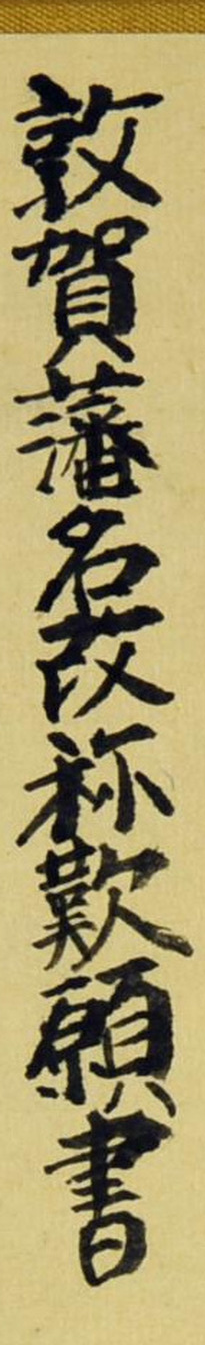敦賀藩命改称歎願書

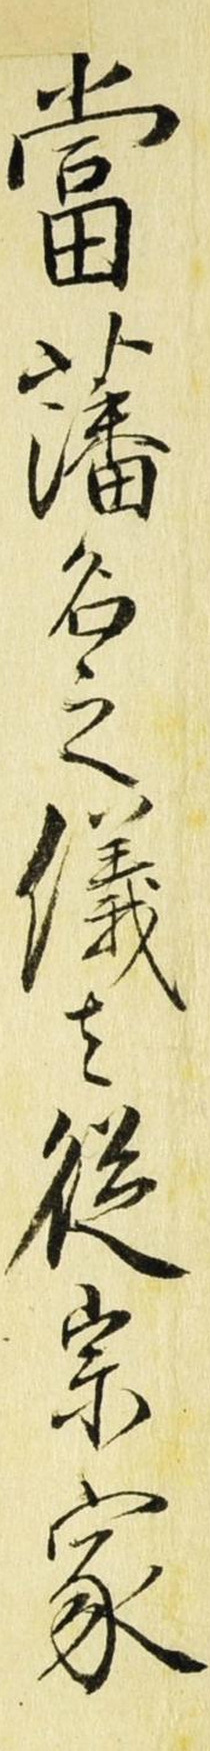当藩名之儀者従宗家
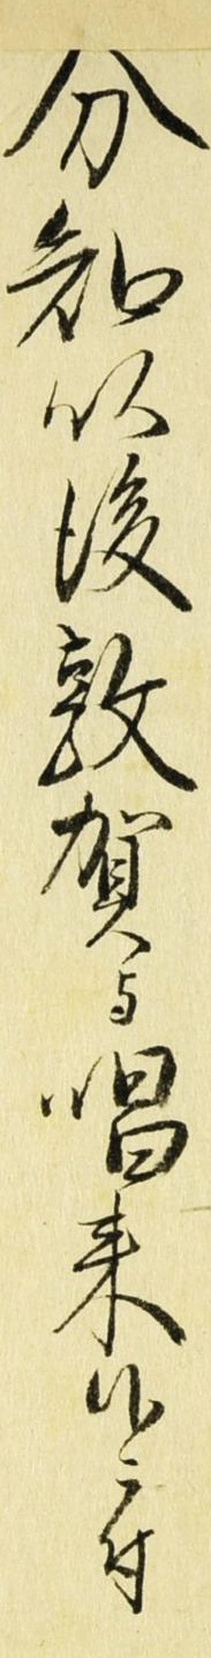分知以後敦賀与唱来候ニ付
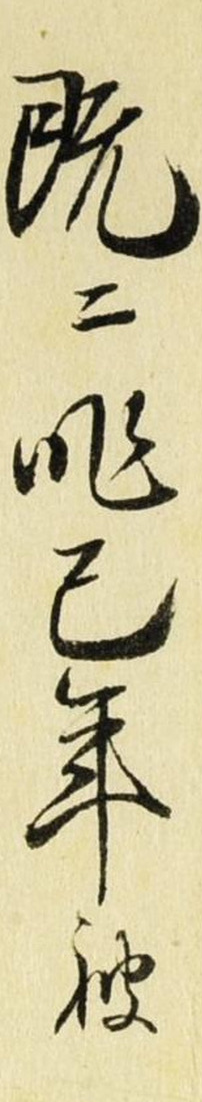既ニ昨巳年被
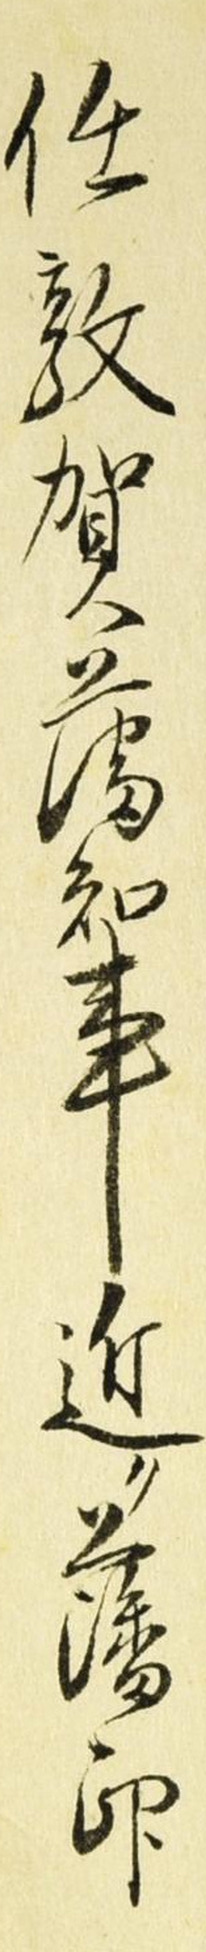任敦賀藩知事近ク藩印
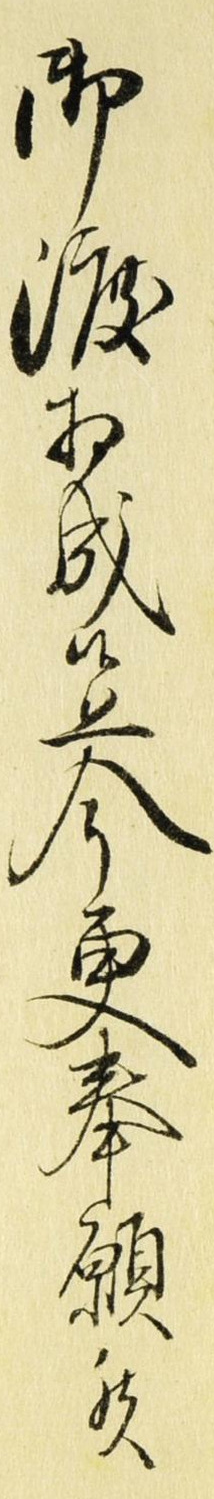御渡相成候上今更奉願候
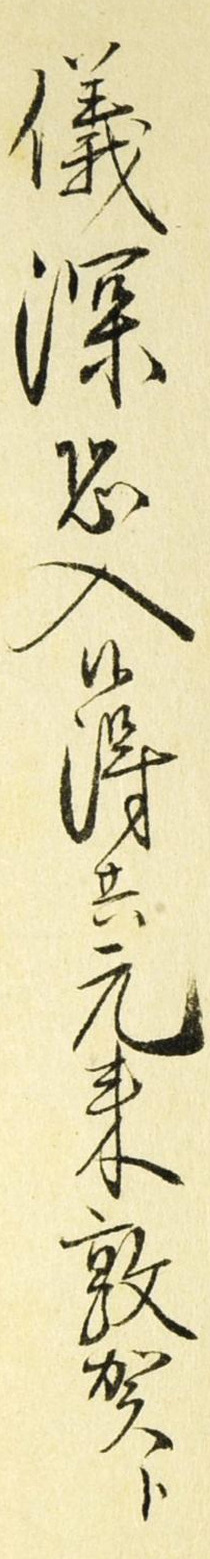儀深恐入候得共元来敦賀ト
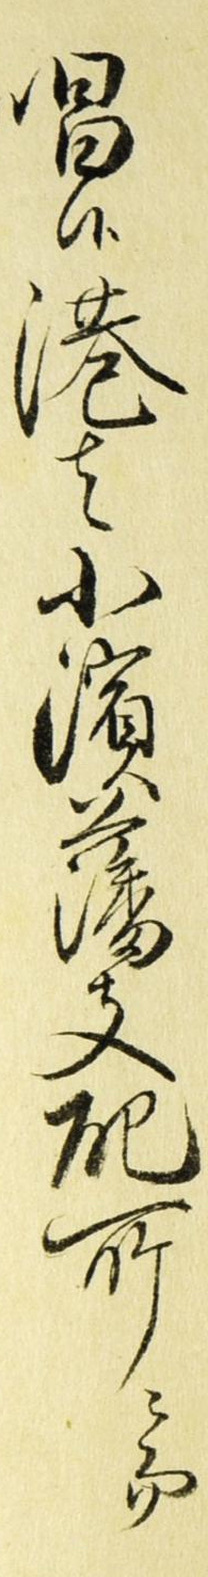唱候港者小浜藩支配所ニ而

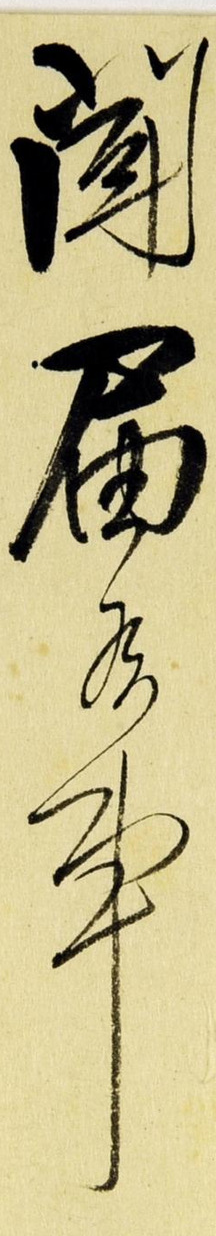聞届候事

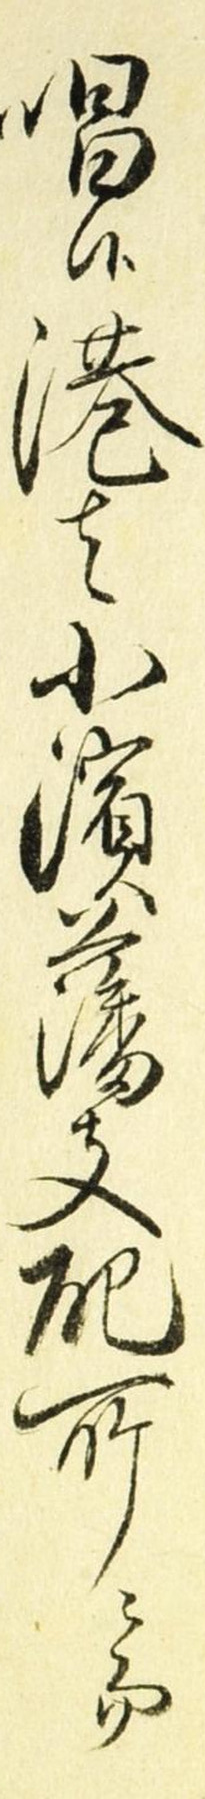唱候港者小浜藩支配所ニ而
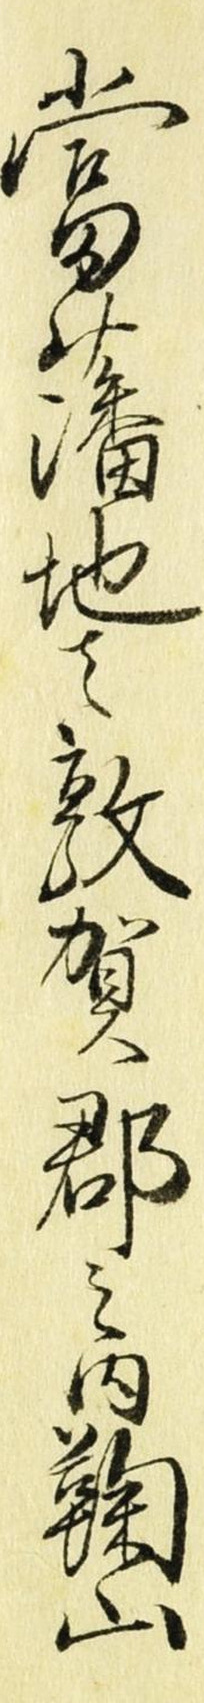当藩地者敦賀郡之内鞠山
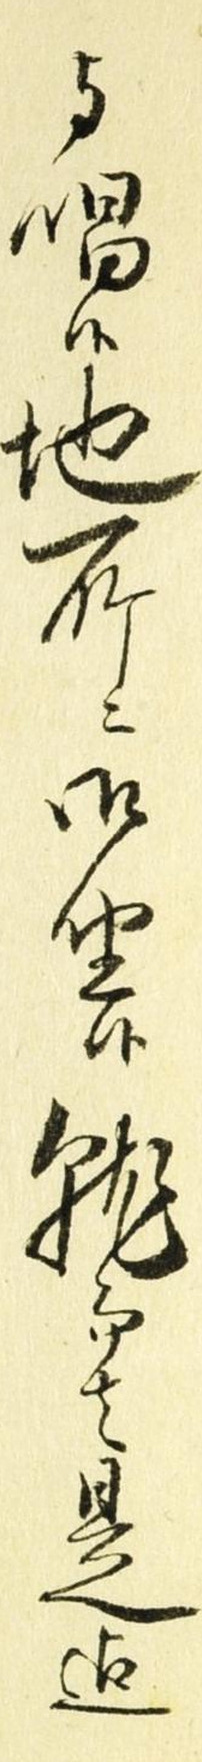与唱候地所ニ御座候就而者是迄
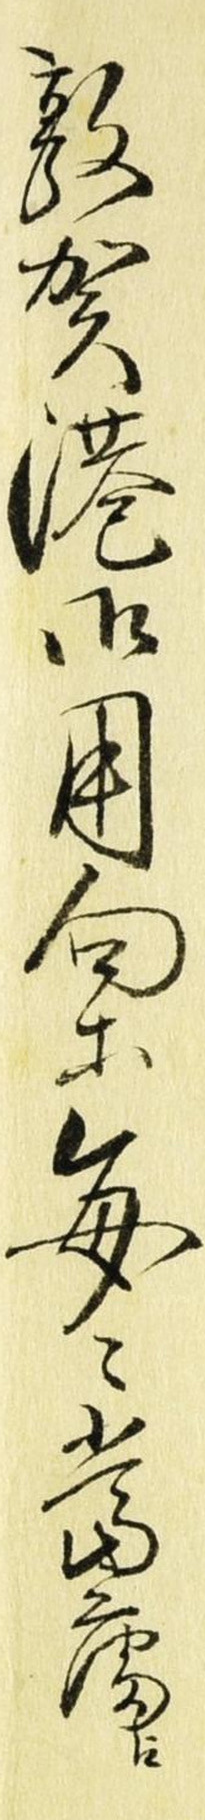敦賀港御用向等毎々当藩江
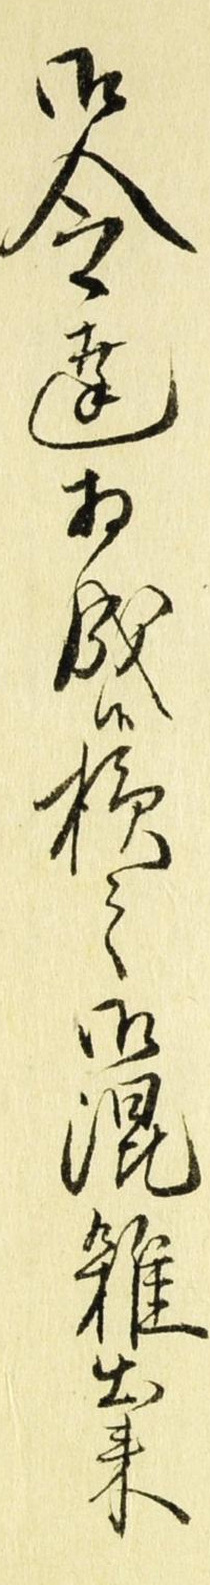御令達相成候様之御混雑出来
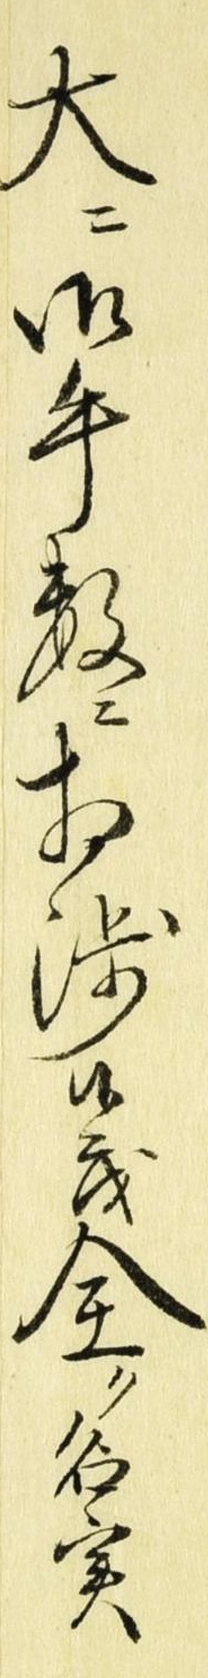大ニ御手数ニ相捗候茂全ク名実
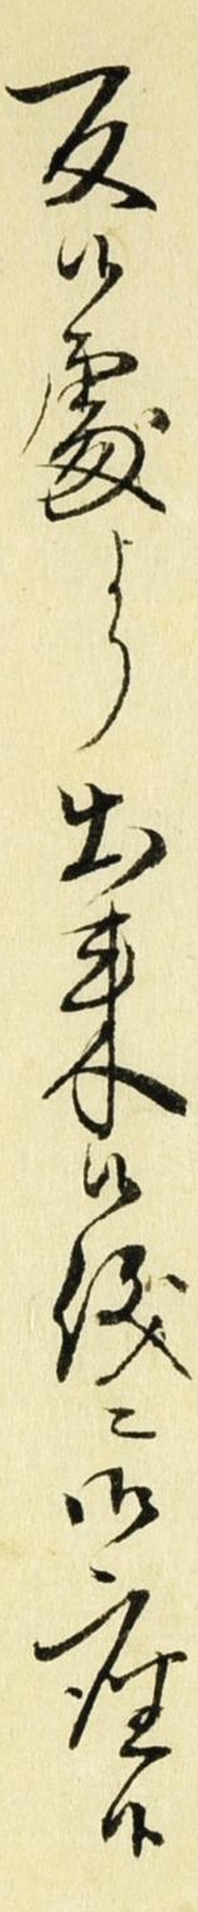反候処より出来候儀ニ御座候
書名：敦賀藩名改称歎願書
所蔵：福井県立図書館
